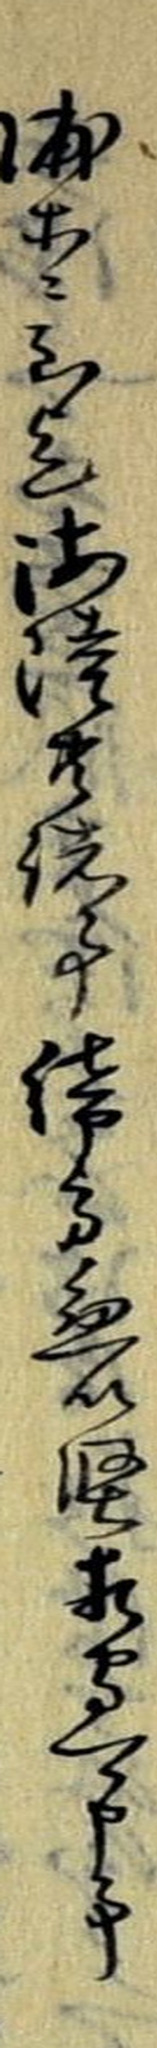浦等ニ至迄海陸共諸事締方愈以堅相守可申事
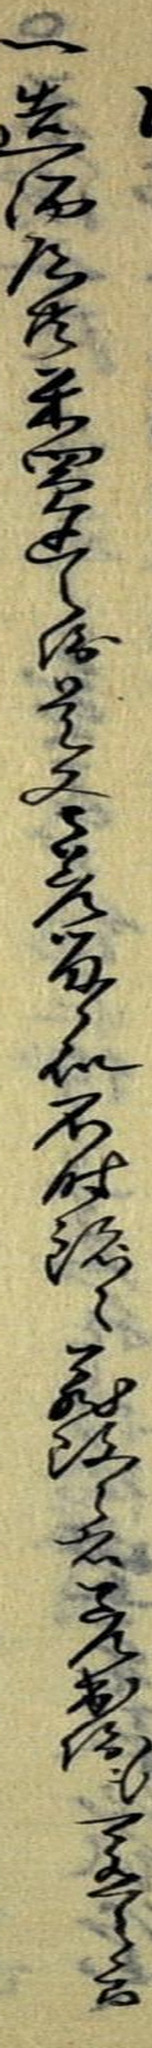一造酒屋并米買込之儀是又被差留候処不時銘々蔵改之者差出儀も可有之候旨
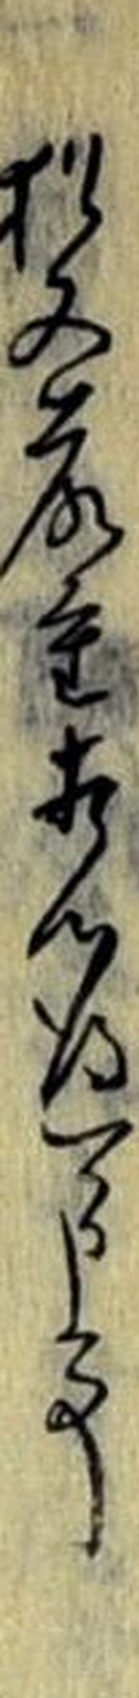猶又厳重相心得可申事
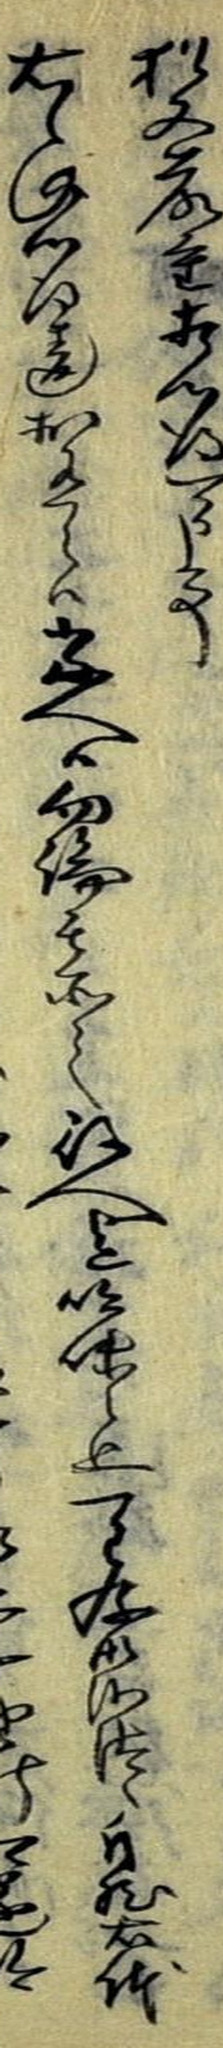右之趣心得違於有之ハ当人ハ勿論其所之役人迄吟味之上可被及御沙汰候自然右体
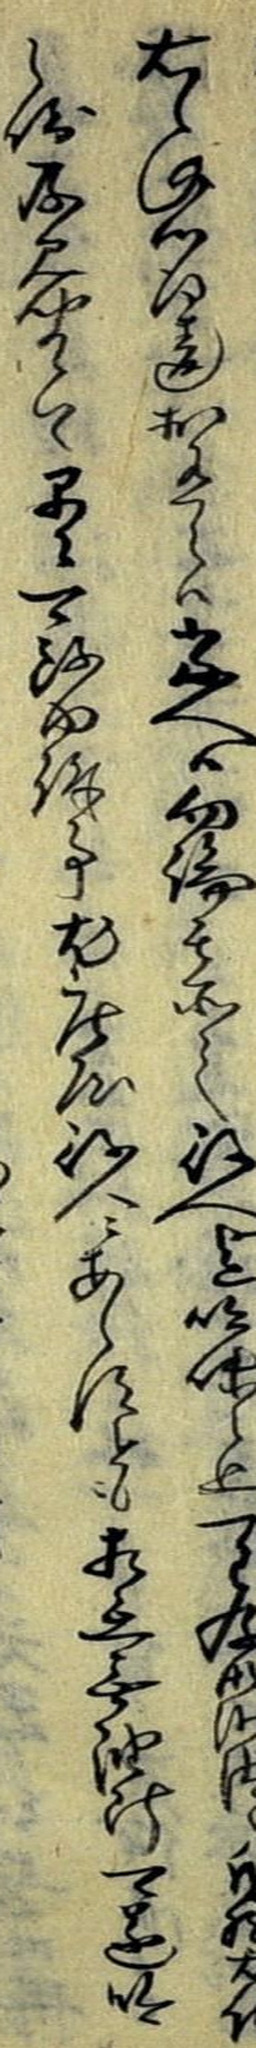之儀及見聞候ハヽ早々可致内訴事尤庄屋役人ニあらすとも相宜無油断可遂吟
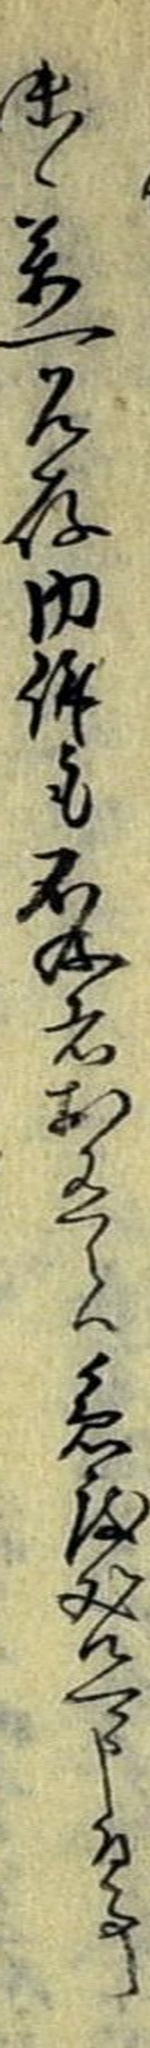味候万一乍存内訴ニも不及者於有之ハ急度咎可申付事
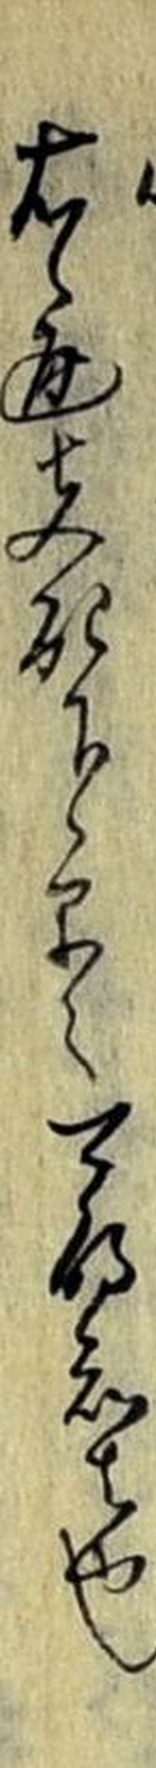右之通支配下へ早々可触知者也
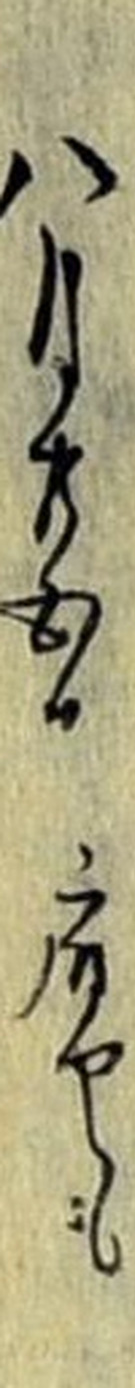八月廿五日府中へも
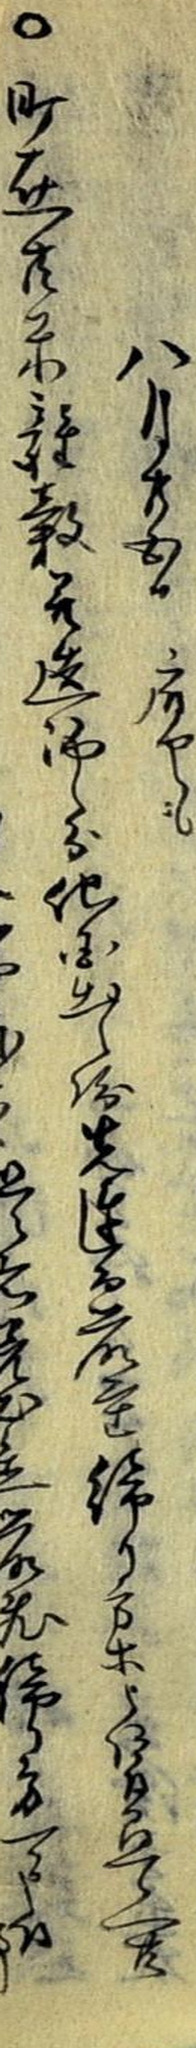○町在共米雑穀并造酒之分他国出之儀先達而厳重締り方等被仰付置候へ共
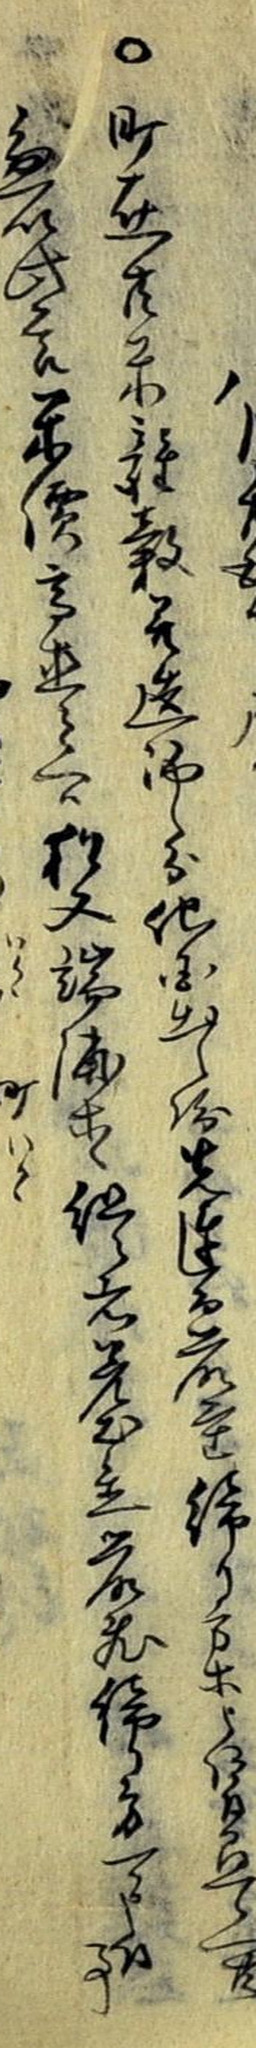愈以此節米価高直ニ候へハ猶又端浦等へ組之者差出置厳敷締り方可申付事
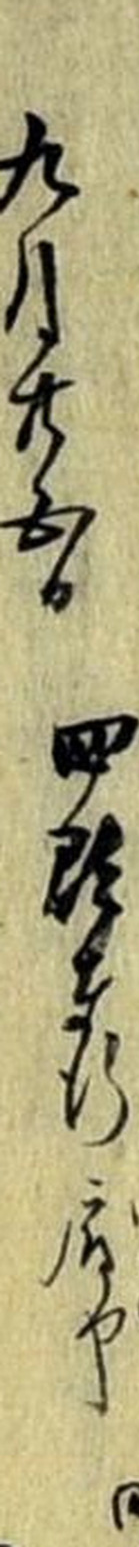九月廿五日四郡奉行府中町
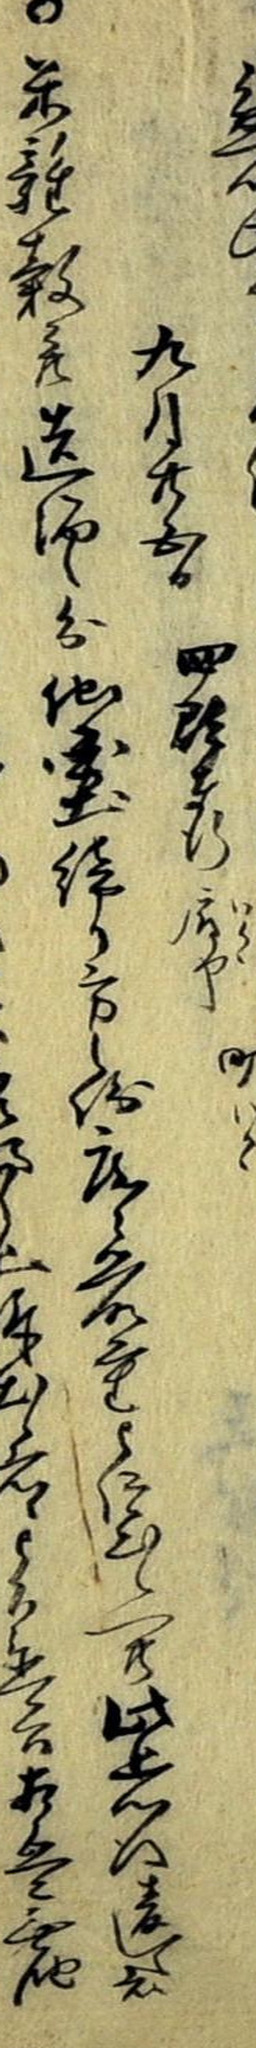○米雑穀并造酒之分他国出締り方之儀度々厳重被仰出候へ共此上心得違之者
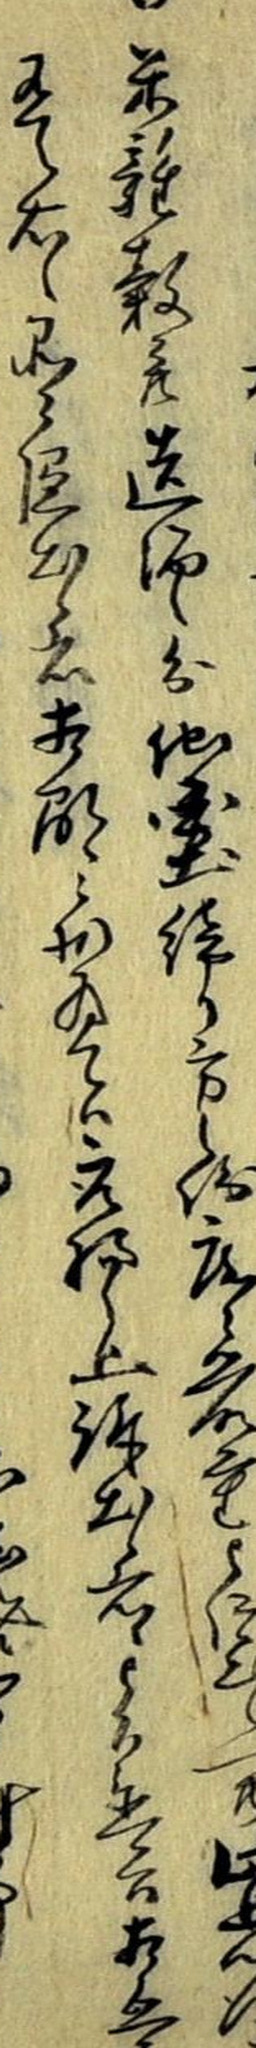有之右之品々隠出候者相顕ニおゐてハ取揚之上訴出候者へ被下置候ハヽ相互ニ無油
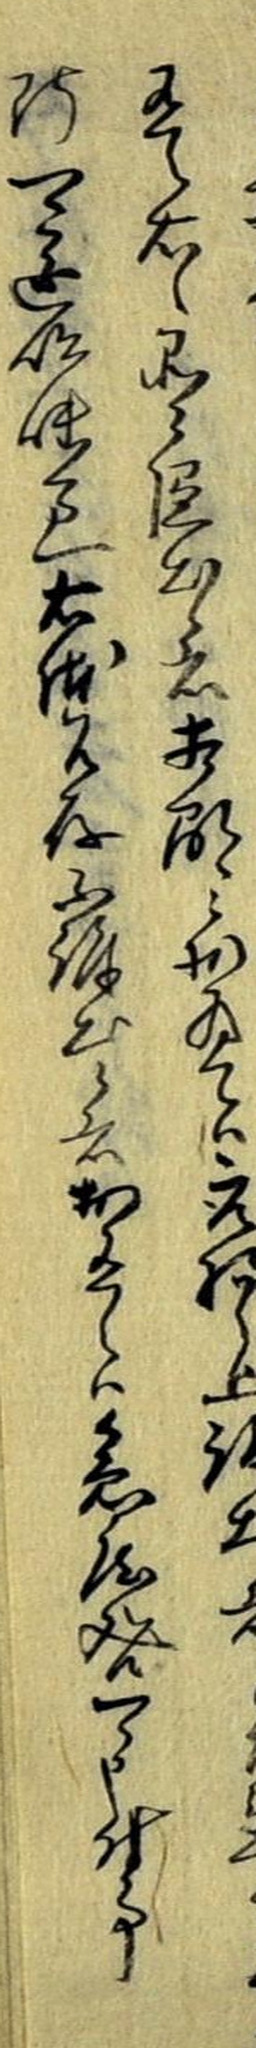断可遂吟味万一右体乍存不訴出候者於有之ハ急度咎可申付事

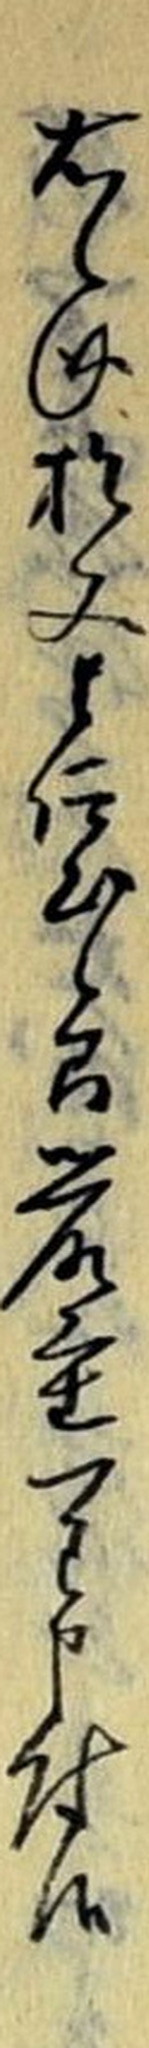右之趣猶又被仰出候間厳重可被申付候
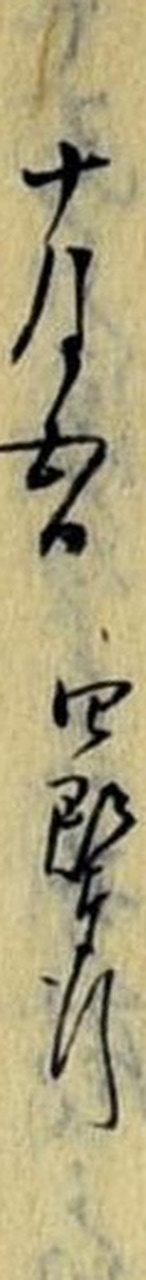十月五日四郡奉行
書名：命令之部 五
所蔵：福井県文書館 Fukui Prefectural Archives
